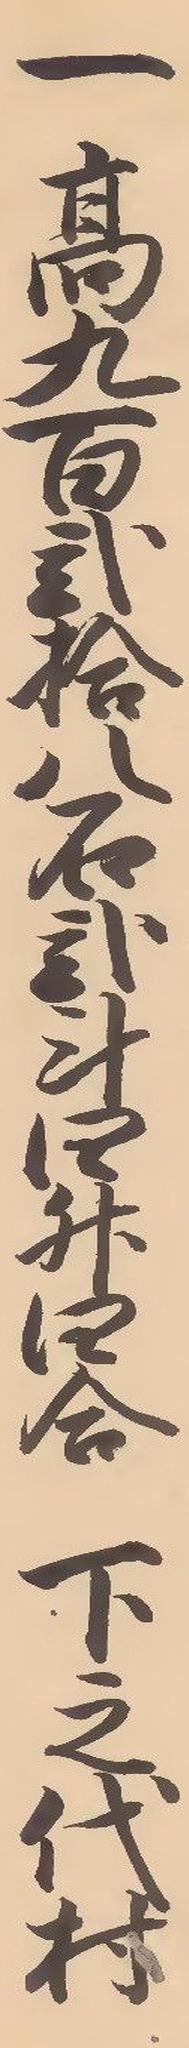一高九百弐拾八石弐斗四升四合下之代村
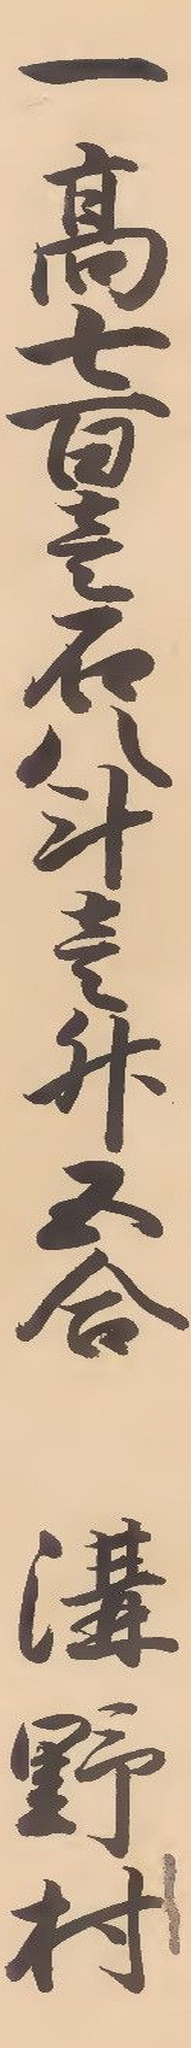一高七百壱石八斗壱升五合溝野村
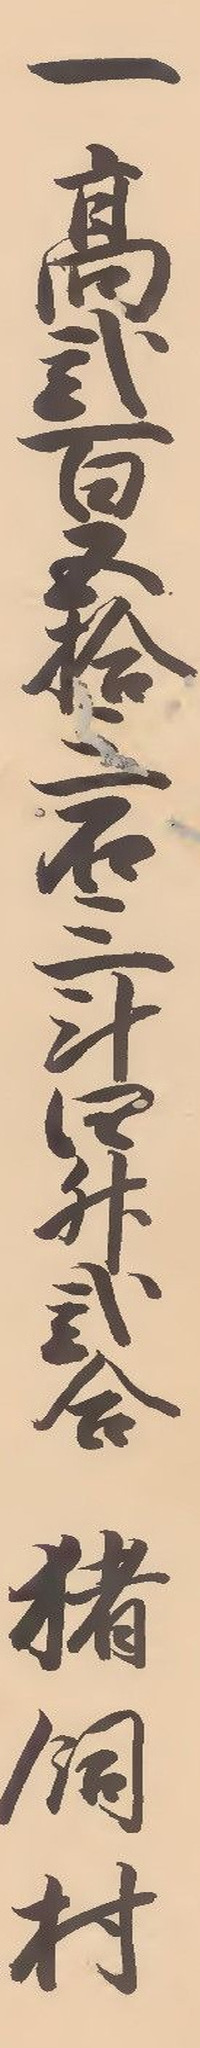一高弐百五拾三石三斗四升弐合猪飼村
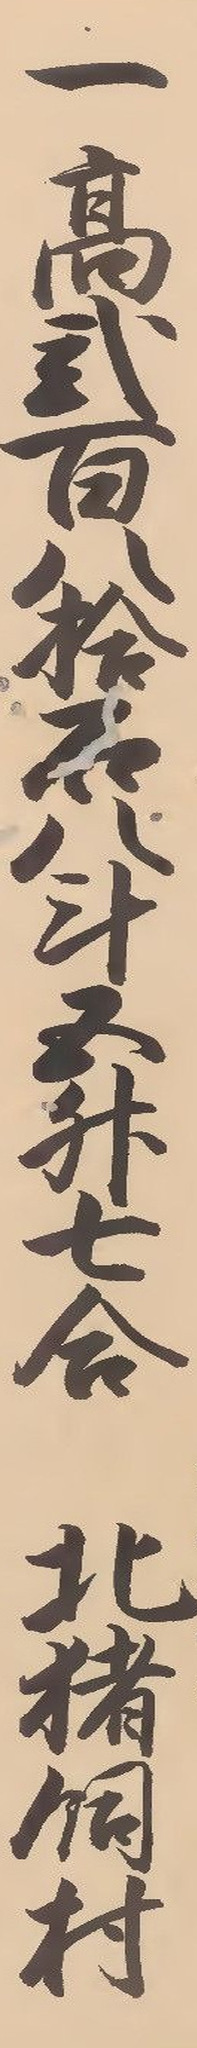一高弐百五拾三石三斗四升弐合猪飼村
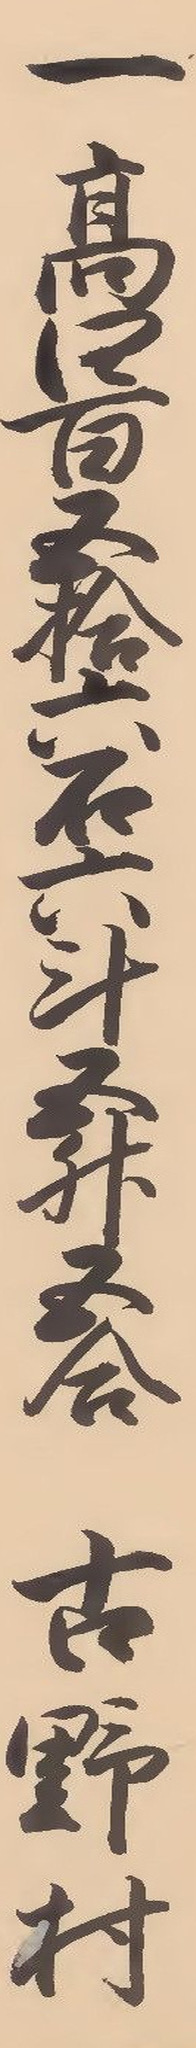一高四百五拾六石六斗五升五合古野村
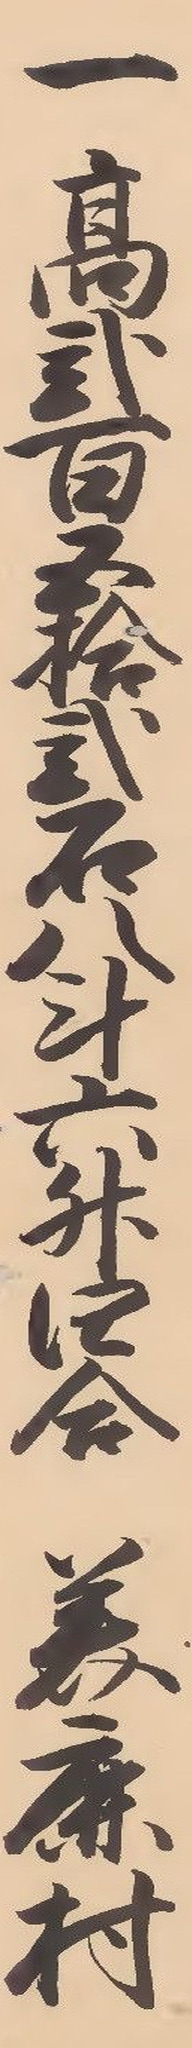一高弐百五拾弐石八斗六升四合美鹿村

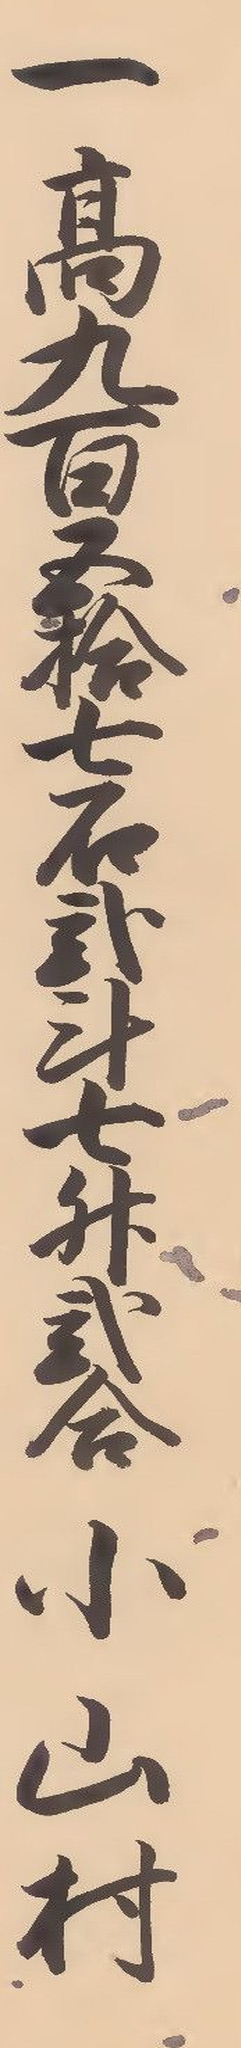一高九百五拾七石弐斗七升弐合小山村
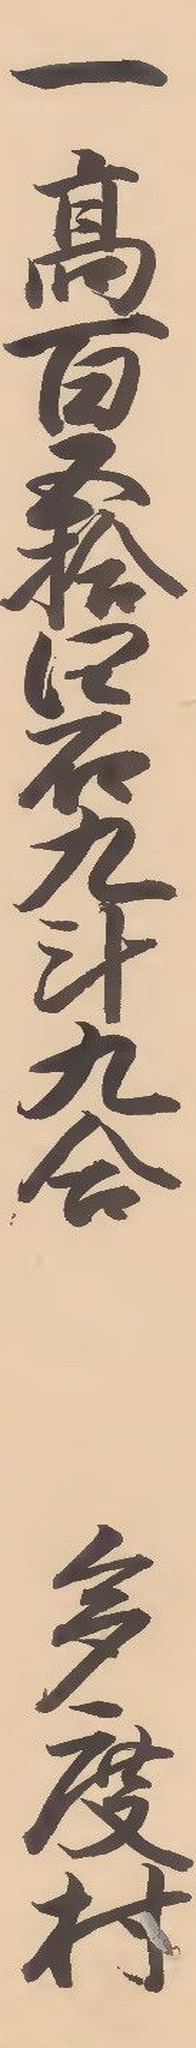一高百五拾四石九斗九合多度村
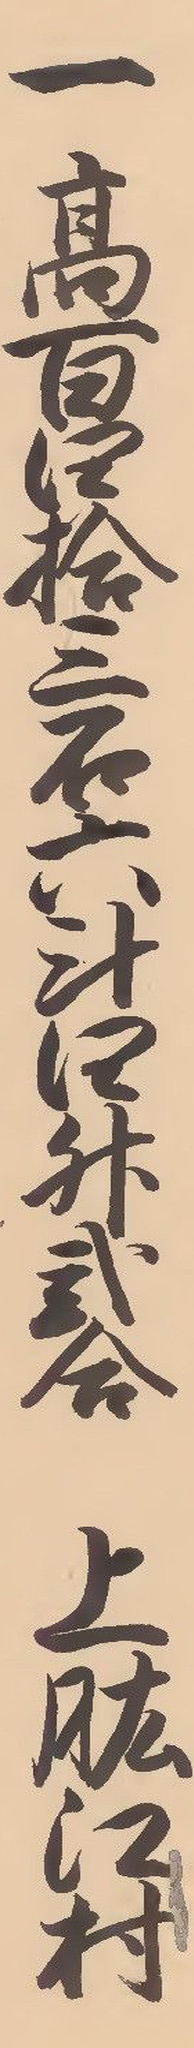一高百四拾三石六斗四升弐合上肱江村
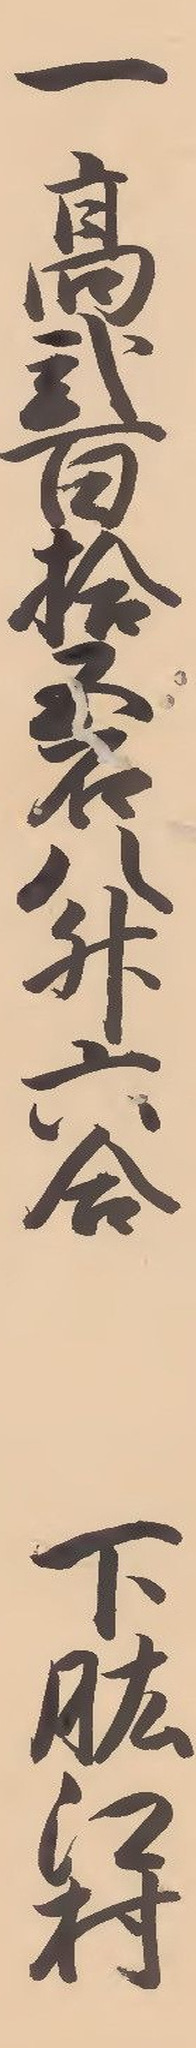一高弐百拾五石八升六合下肱江村
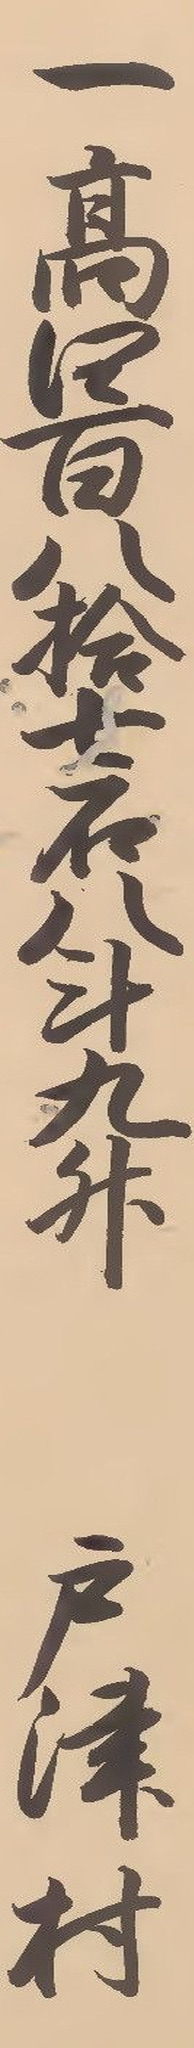一高四百八拾七石八斗九升戸津村
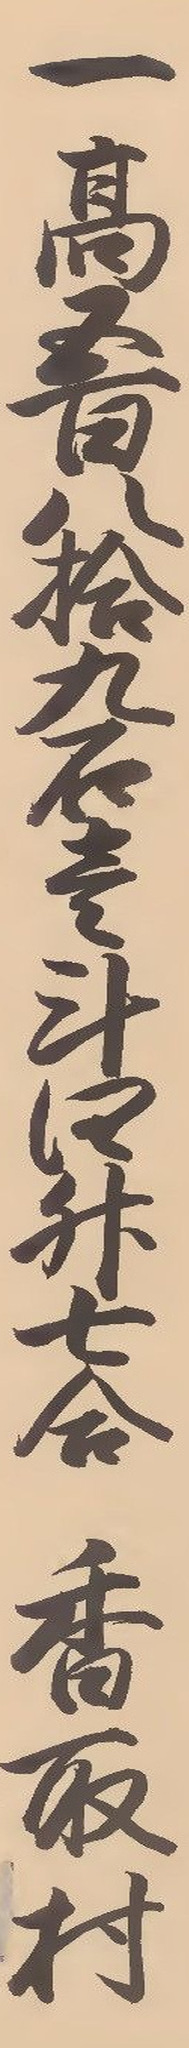一高五百八拾九石壱斗四升七合香取村
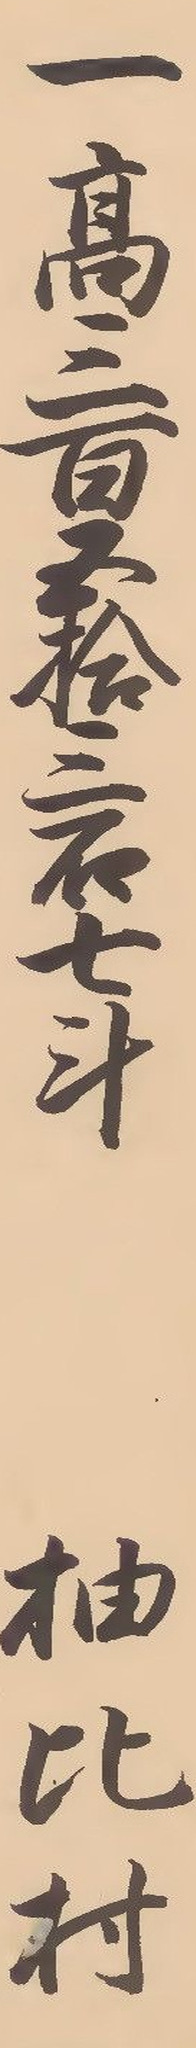一高三百五拾三石七斗柚比村
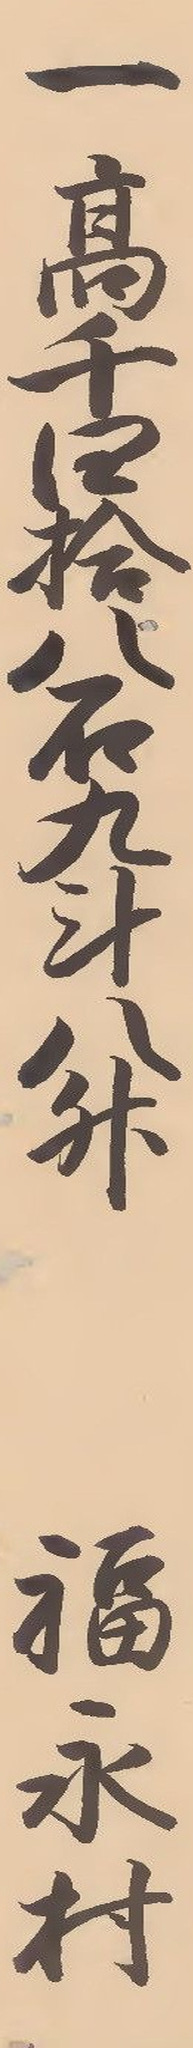一高千四拾八石九斗八升福永村

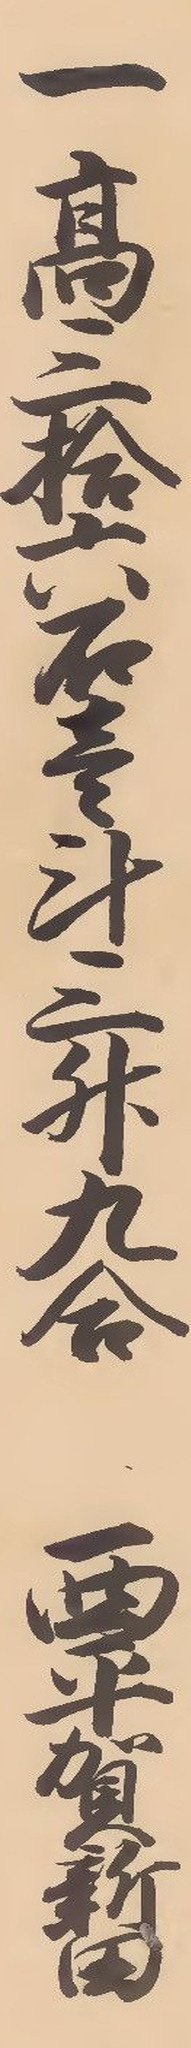一高三拾六石壱斗三升九合西平賀新田
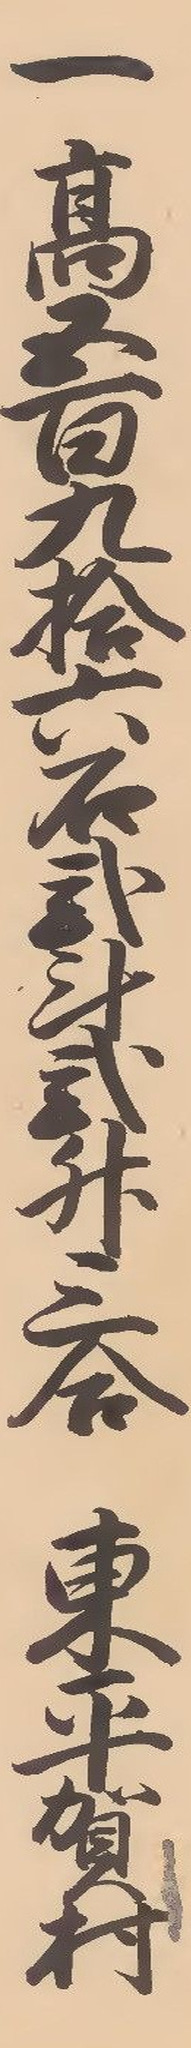一高五百九拾六石弐斗弐升三合東平賀村
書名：伊勢国郷帳
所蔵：国立公文書館 National Archives of Japan
